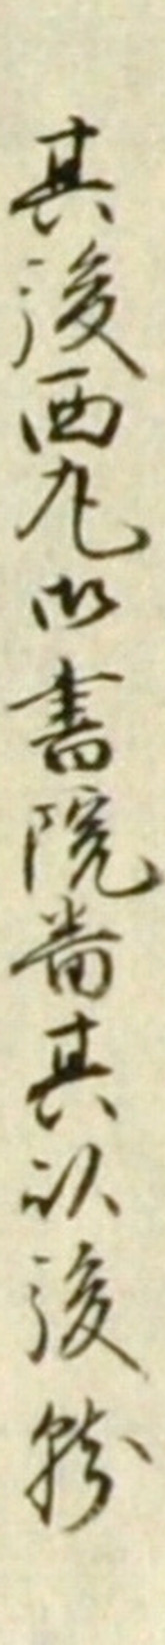其後西丸御書院番其以後就
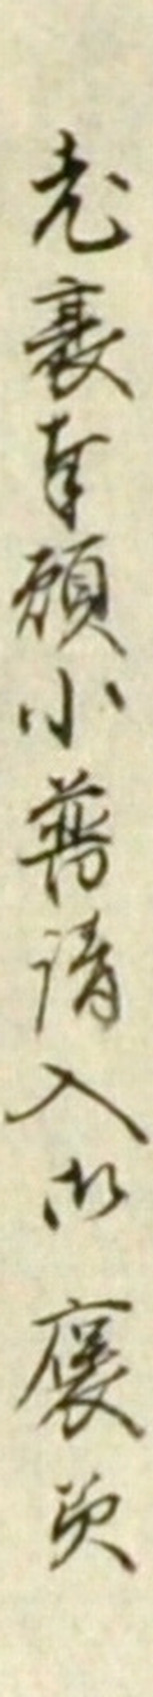老衰奉願小普請入御褒美
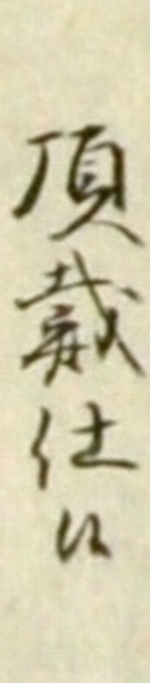頂戴仕候
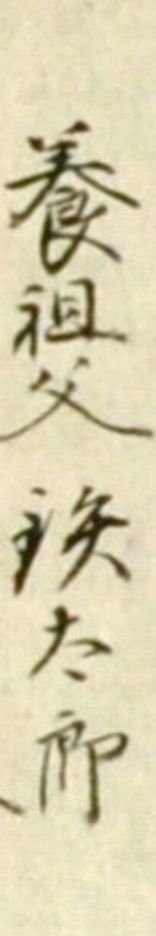養祖父鉄太郎
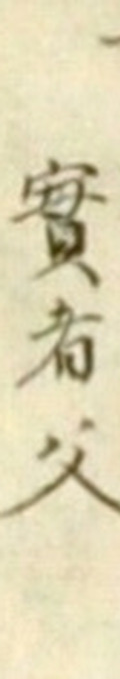實者父
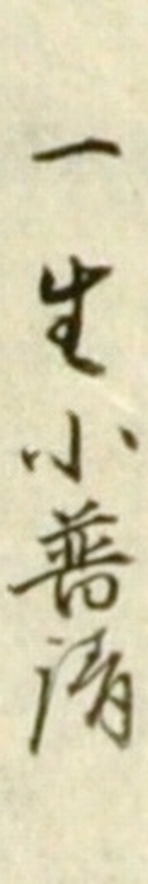一生小普請
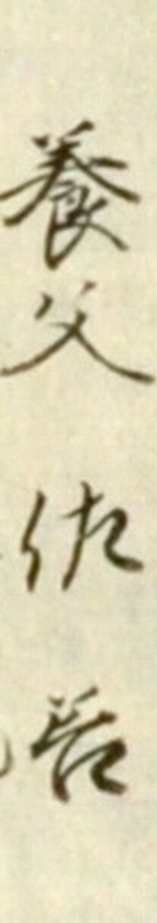養父佐善
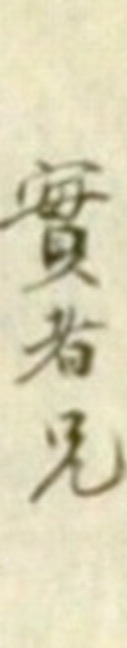實者兄
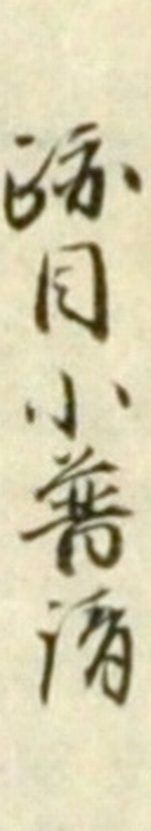跡目小普請
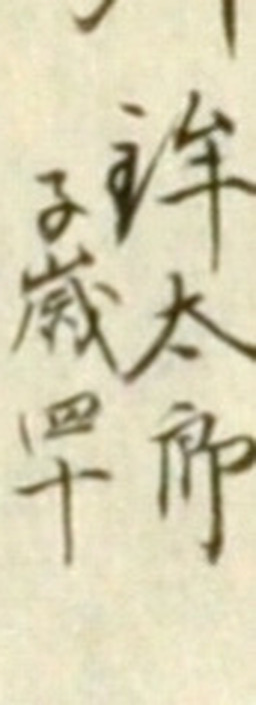子歳四十
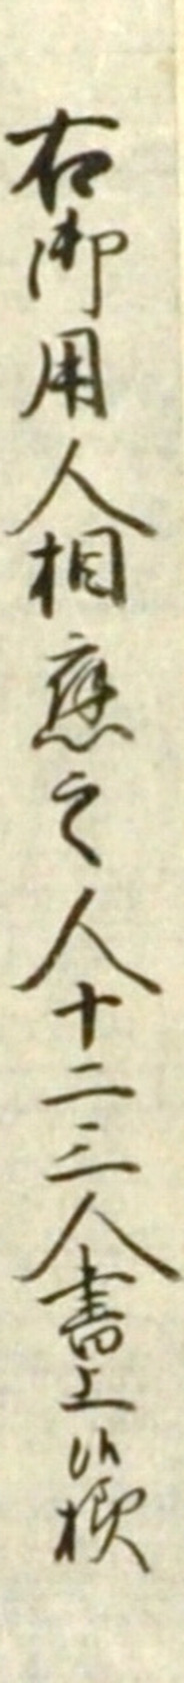右御御用人相應之人十二三人書上候様
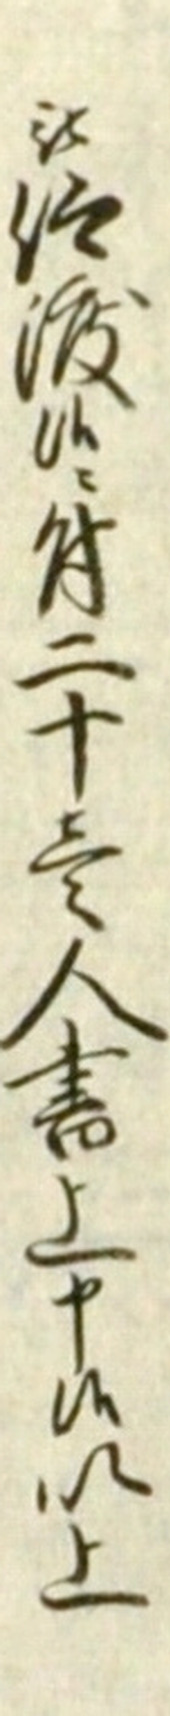被仰渡候ニ付二十壱人書上申候以上

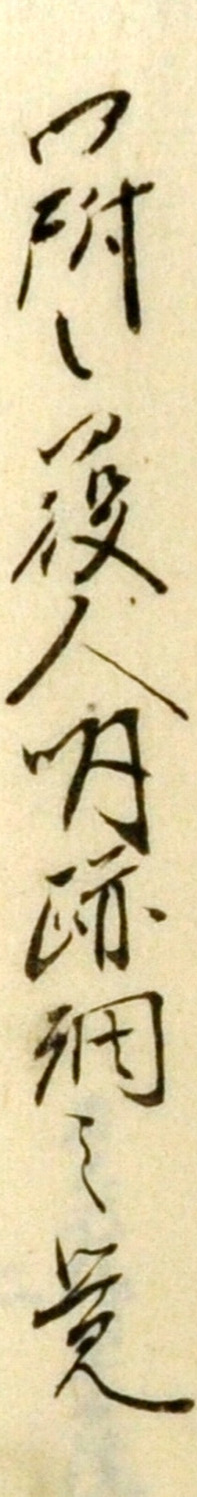御附之御役人明跡調之覚

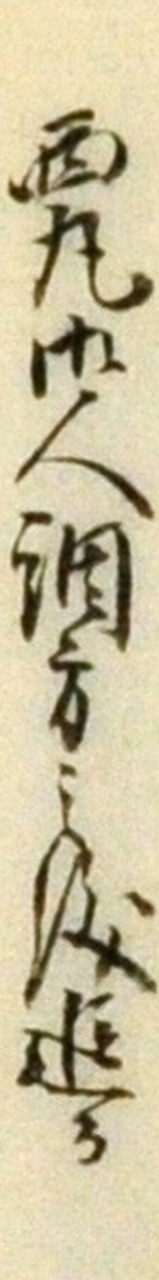西丸御人調方之儀追而
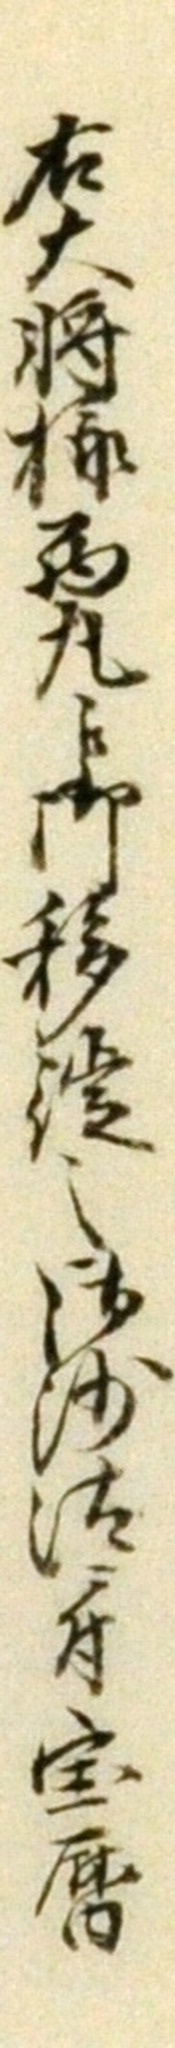右大将様西丸江御移徒之御沙汰ニ付宝暦
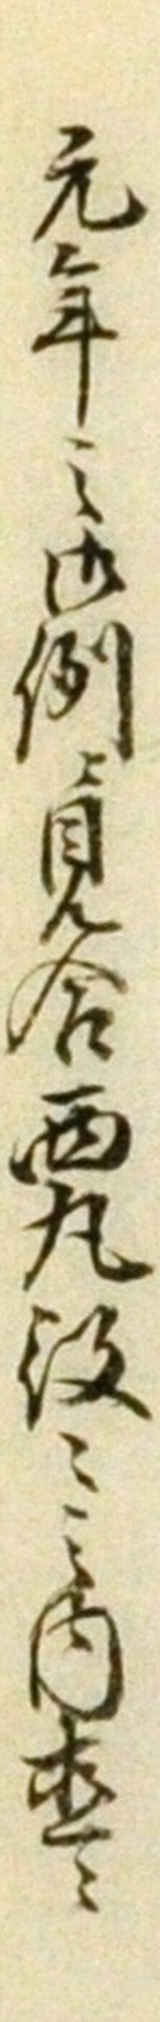元年之御例ニ見合西丸役々之内直ニ
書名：若年寄御役中御調書付
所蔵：伊那市立高遠町図書館・合同会社AMANE
